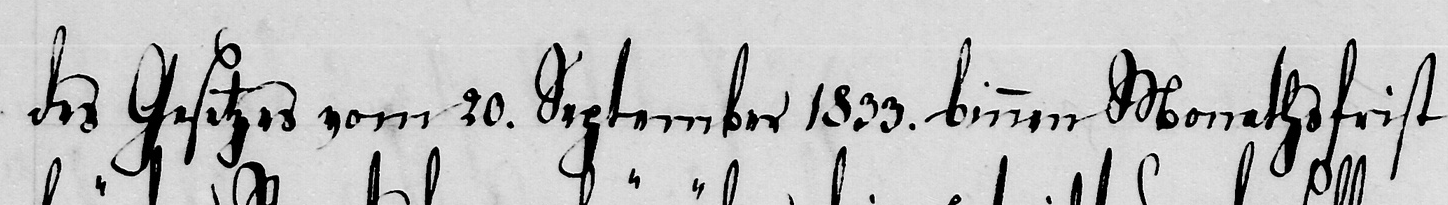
des Gesetzes vom 20. September 1833. binnen Monathsfrist
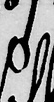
b.)
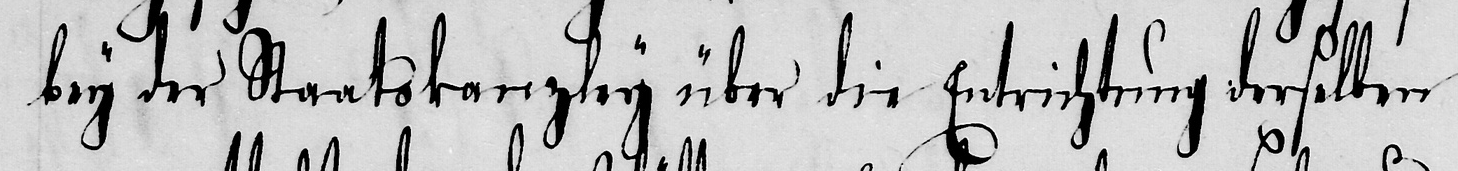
bey der Staatskanzley über die Entrichtung derselben
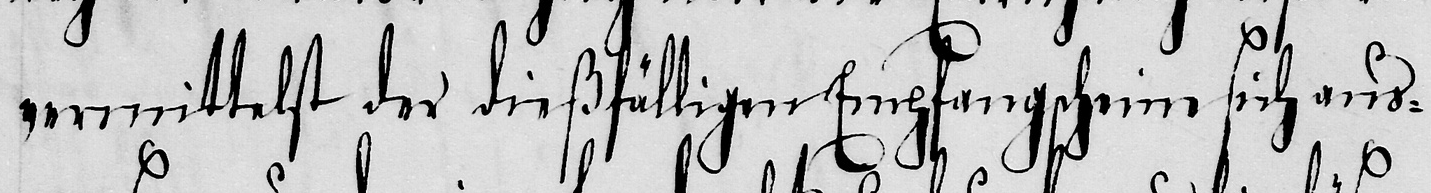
vermittelst der dießfälligen Empfangscheine sich aus¬
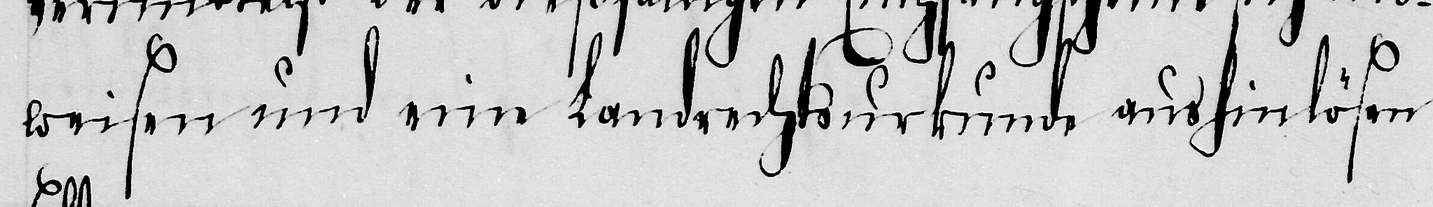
weisen und eine Landrechtsurkunde aushinlösen
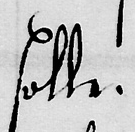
sol¬
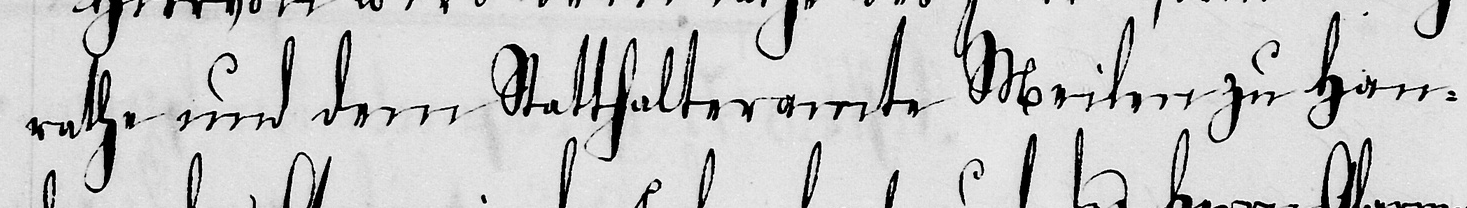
rathe und dem Statthalteramte Meilen zu Han¬
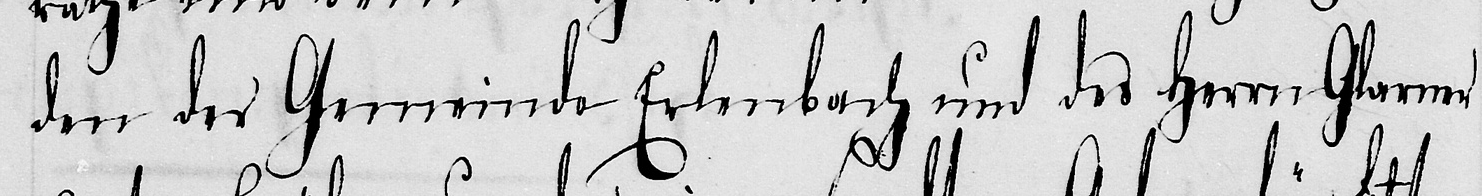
den der Gemeinde Erlenbach und des Herrn Glarner
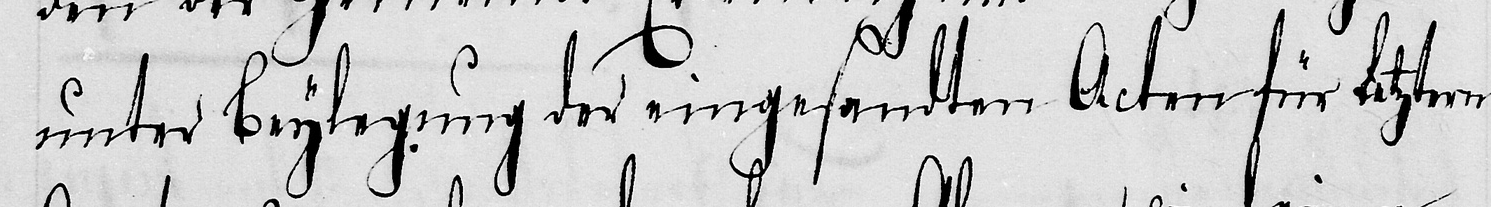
unter Beylegung der eingesandten Acten für Letzte¬
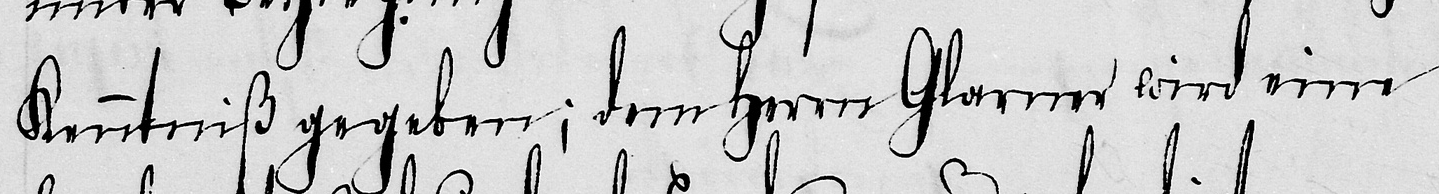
Kenntniß gegeben; dem Herrn Glarner wird eine
